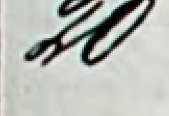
20
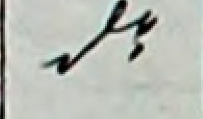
do
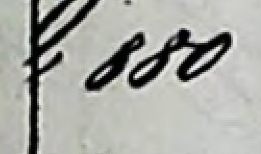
0,880
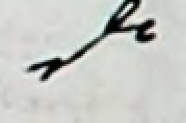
do
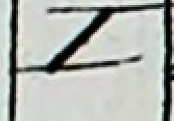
I
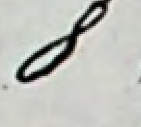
8
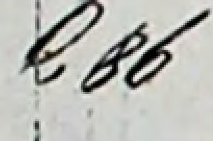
0,86
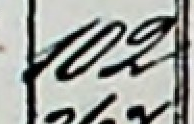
102
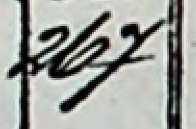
267
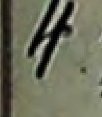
4
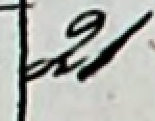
21
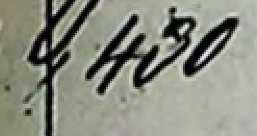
0,430
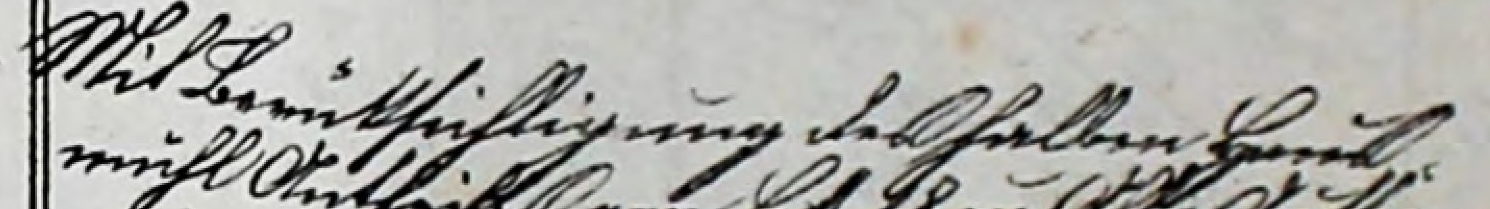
Mit Berücksichtig des halben Haus„
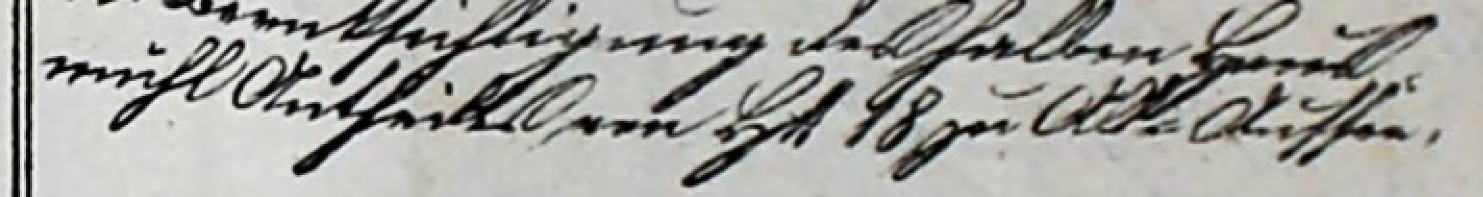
muhl Antheiles von H? 18 zu Alt=Aussee
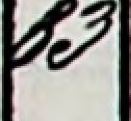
83
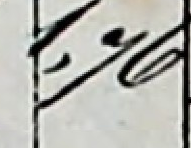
1,76
